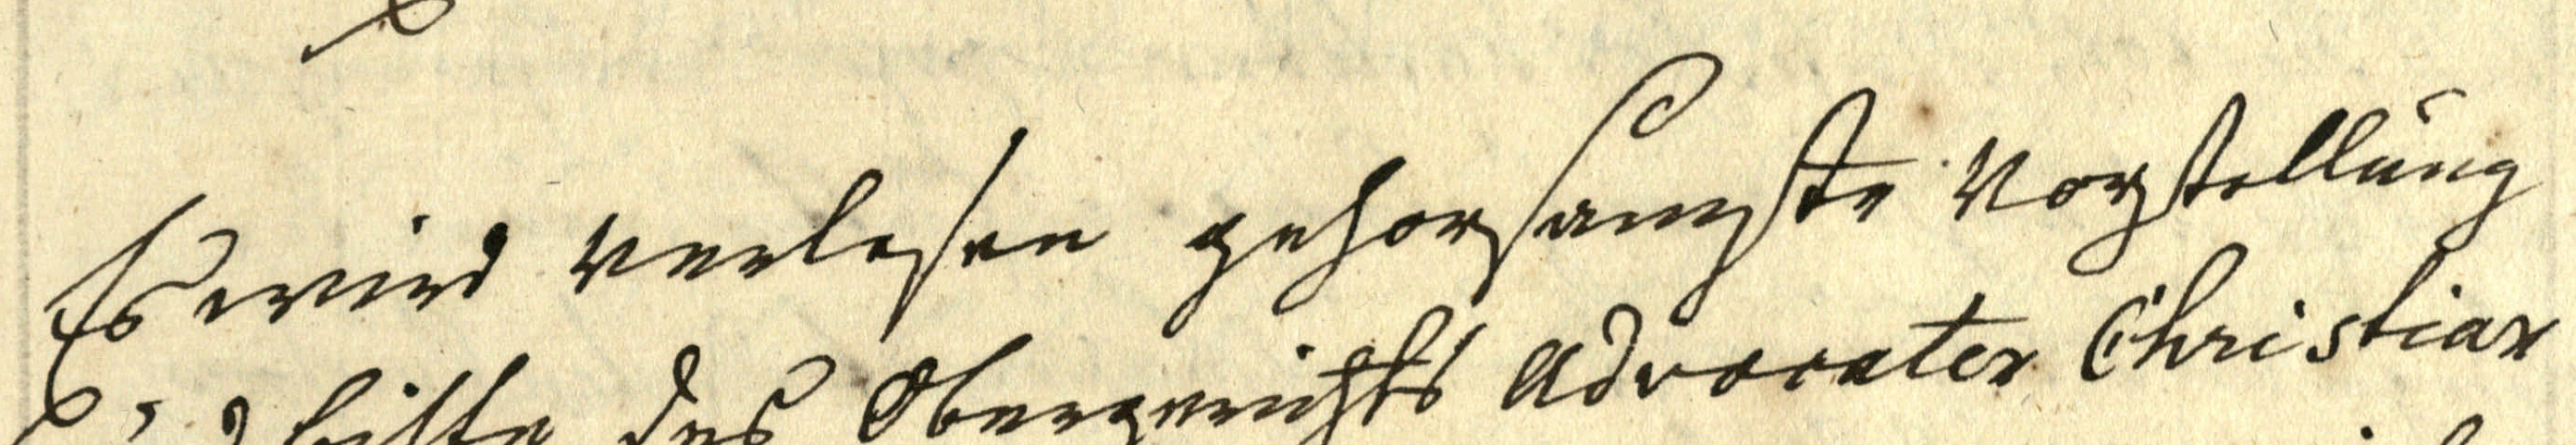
Es wird verlesen gehorsamste Vorstellung
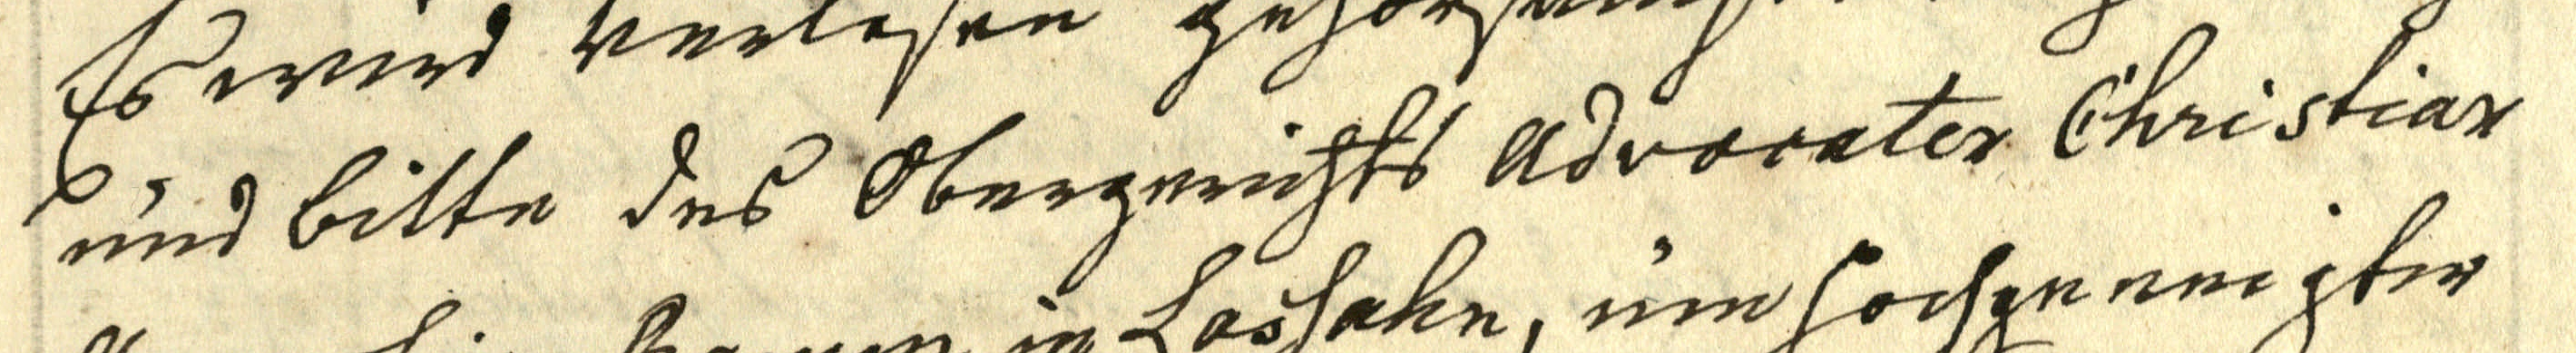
und Bitte des Obergerichts Advocaten Christian
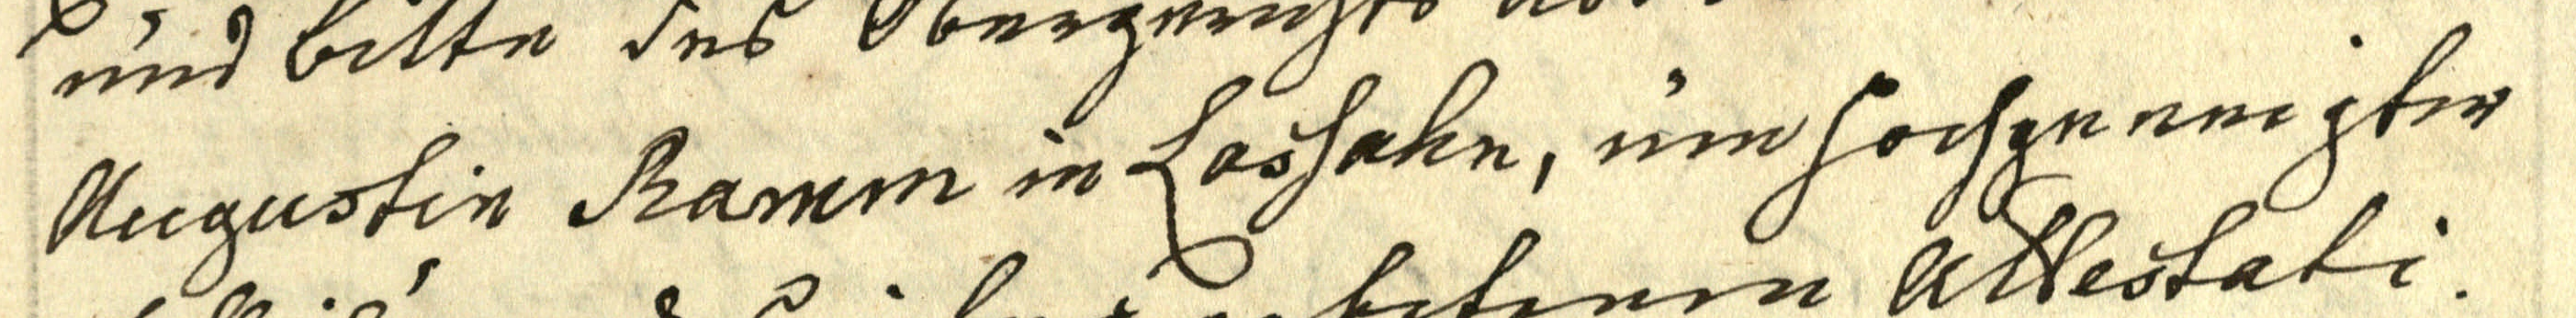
Augustin Ramm in Lassahn, um hochgeneigter
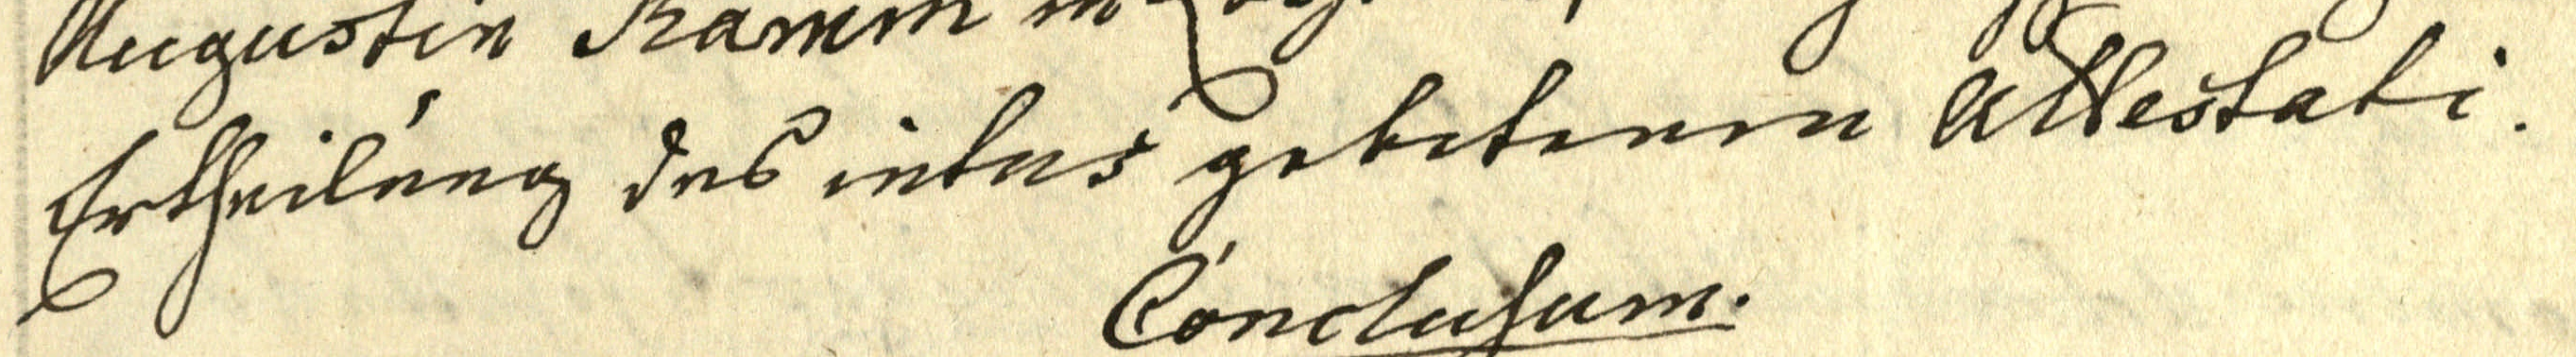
Ertheilung des intus gebetenen Attestati.
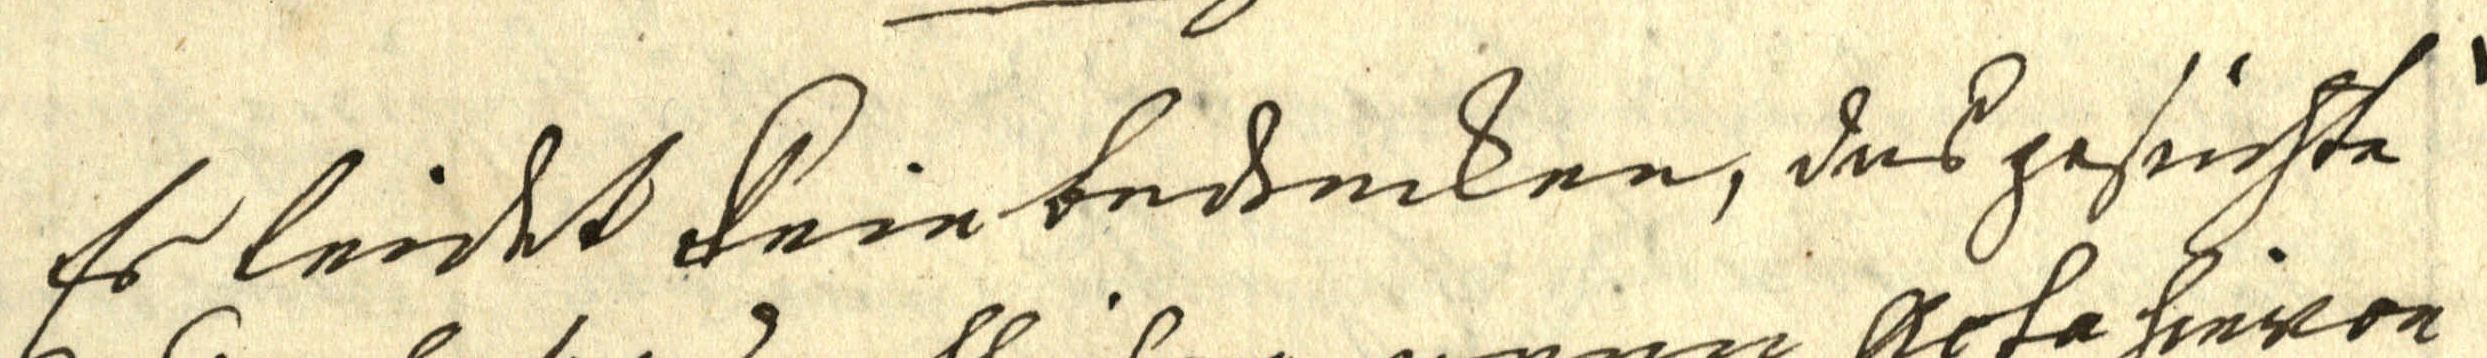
Es leidet keine bedencken, das gesuchte
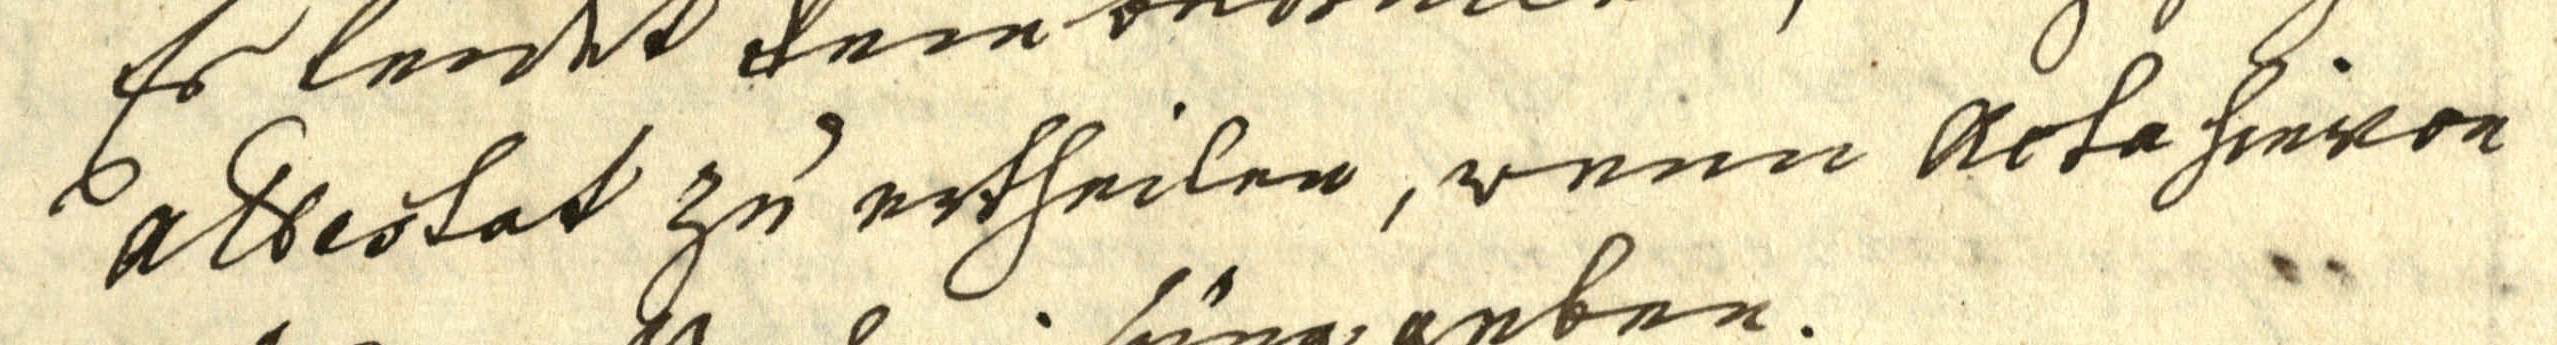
Attestat zu ertheilen, wenn Acta hievon
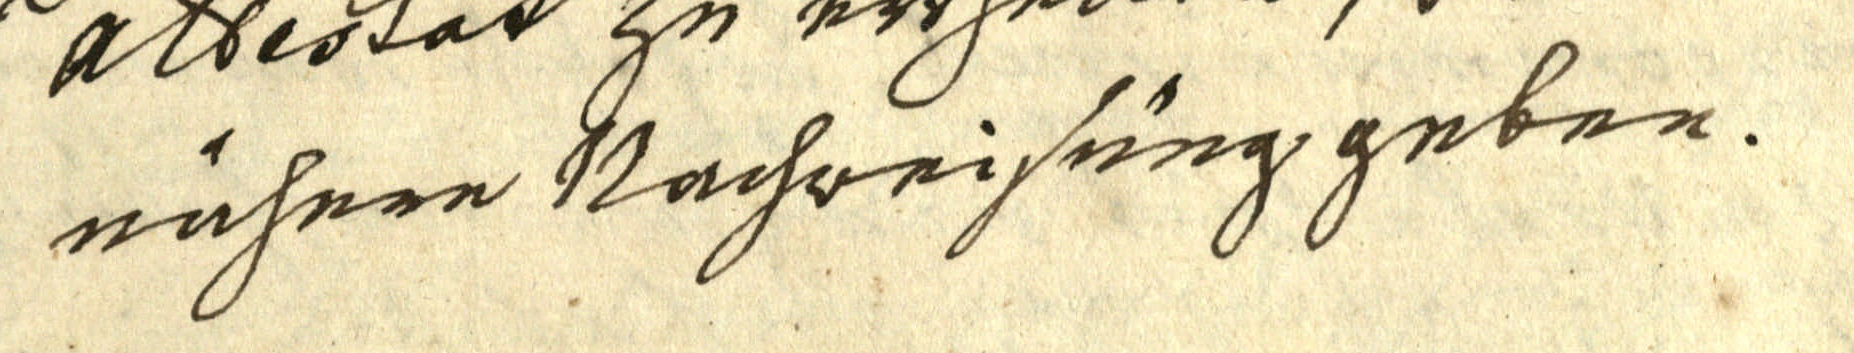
nähere Nachweisung geben.
